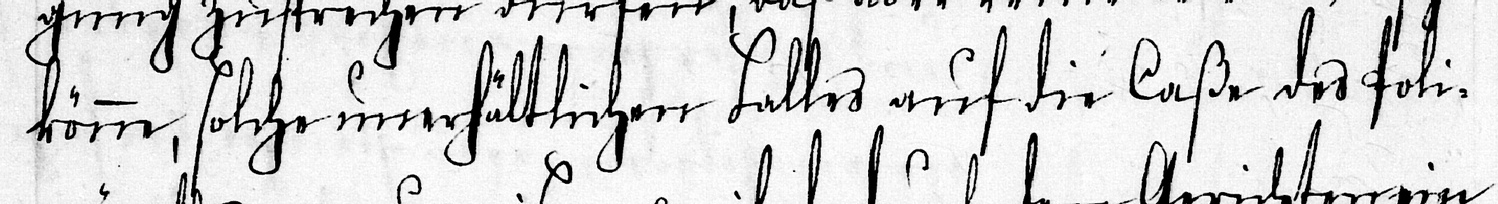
könne, solche unerhältlichen Falles auf die Caße des Poli¬
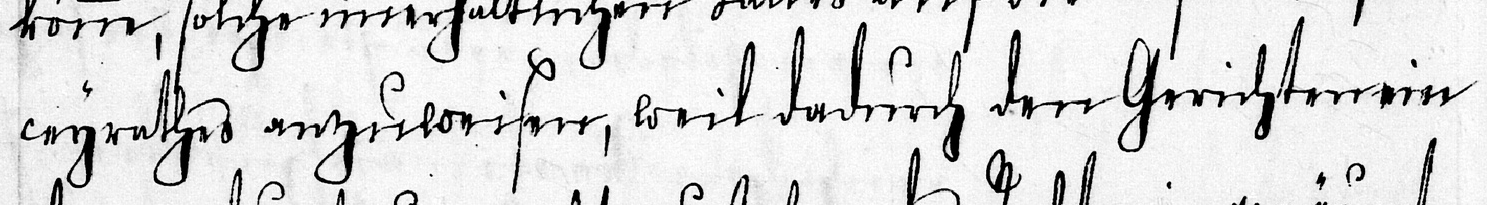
ceyrathes anzuweisen, weil dadurch den Gerichten ein
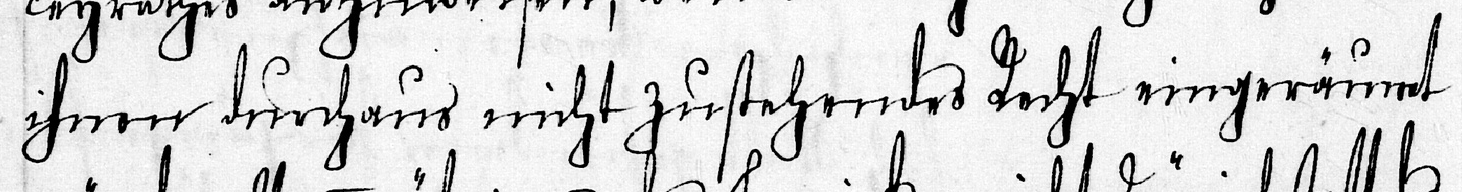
ihnen durchaus nicht zustehendes Recht eingeräumt
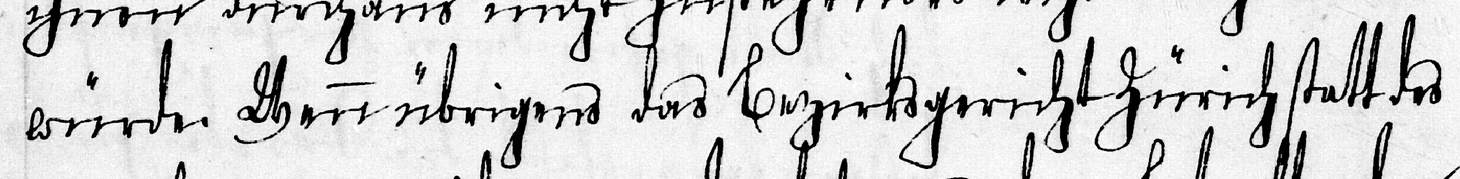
würde. Wenn übrigens das Bezirksgericht Zürich statt
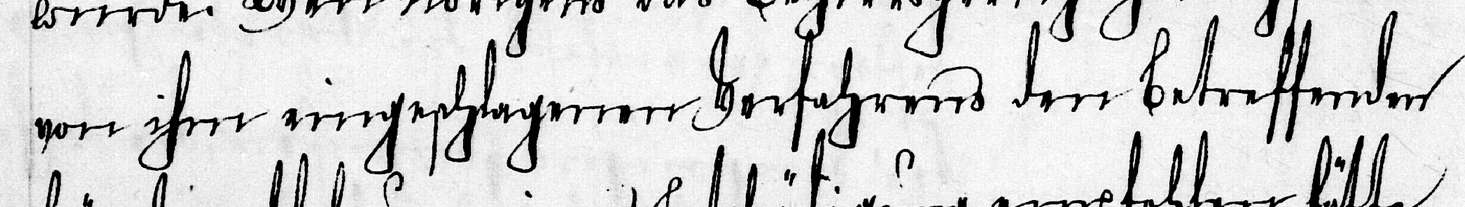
von ihm eingeschlagenen Verfahrens den betreffenden
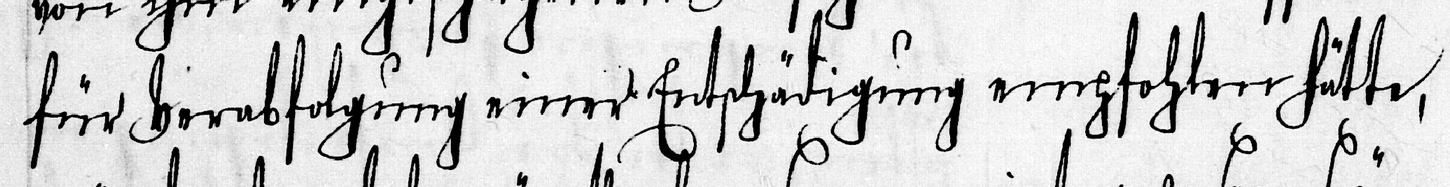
für Verabfolgung einer Entschädigung empfohlen hätte,
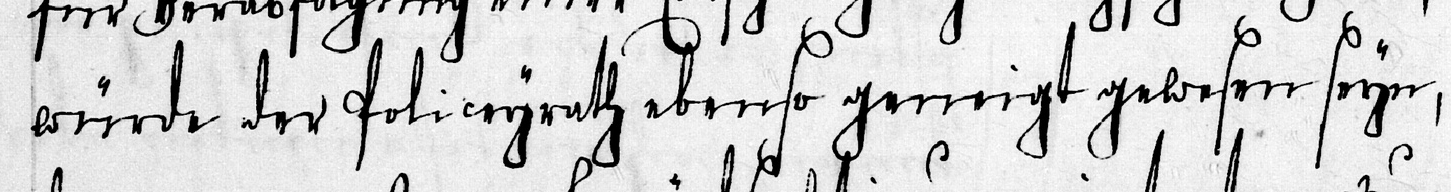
würde der Policeyrath ebenso geneigt gewesen seyn,
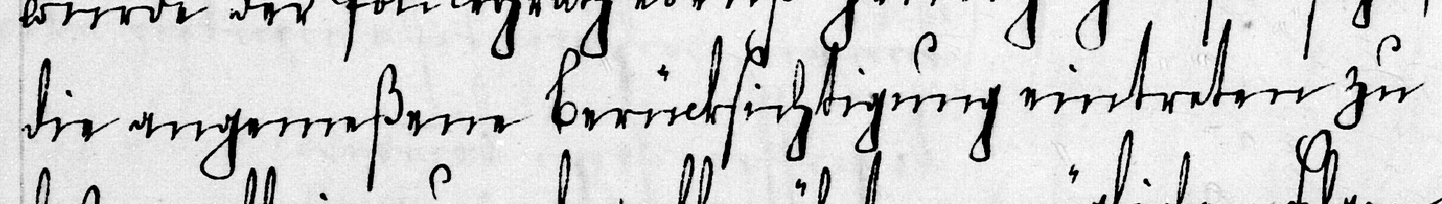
die angemeßene Berücksichtigung eintreten zu
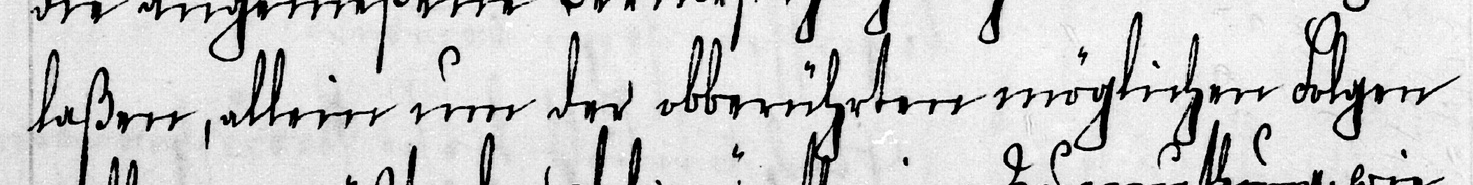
laßen, allein um der obberührten möglichen Folgen
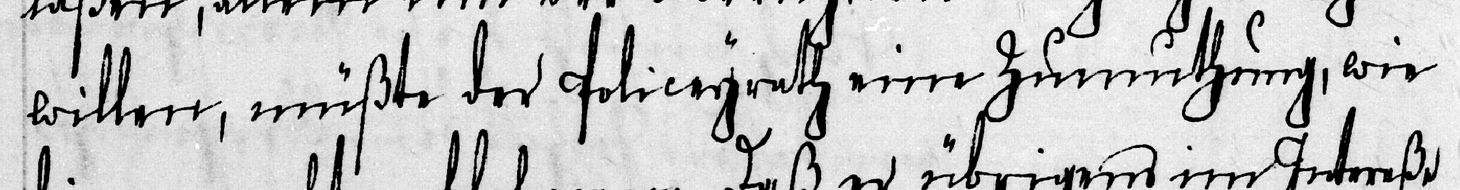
willen, müßte der Policeyrath eine Zumuthung, wie
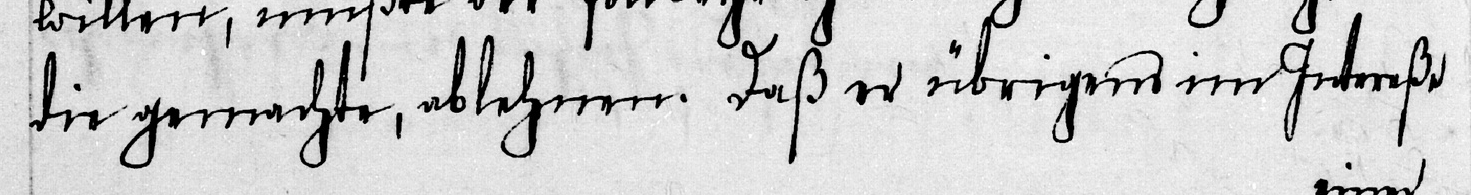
die gemachte, ablehnen. Daß er übrigens im Intereße
